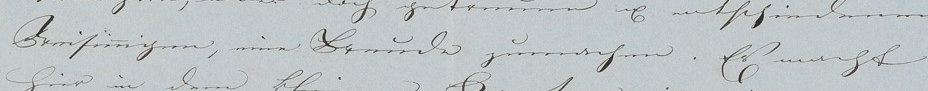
Freisinnigen, eine Freude zumachen. Es macht
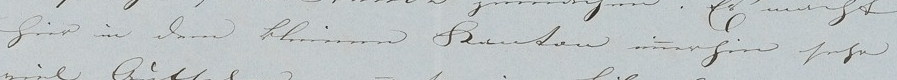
hier in dem kleinen Kanton immerhin sehr
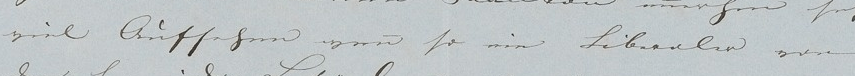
viel Aufsehen wenn so ein Liberaler von
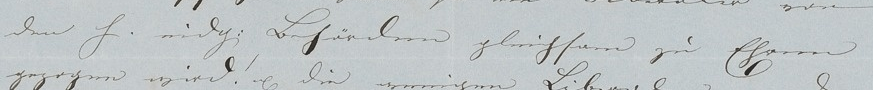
den h. eidg: Behörden gleichsam zu Ehren
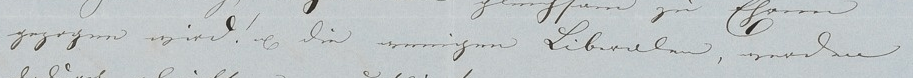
gezogen wird! & die wenigen Liberalen, werden
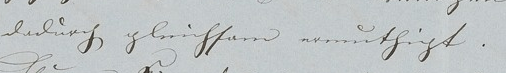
dadurch gleichsam ermuthigt.
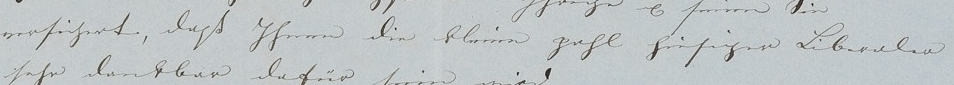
versichert, daß Ihnen die kleine Zahl hiesiger Liberaler
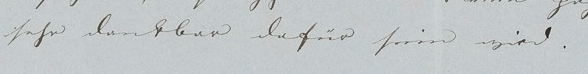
sehr dankbar dafür sein wird.
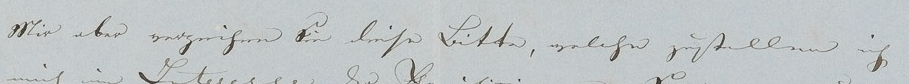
Mir aber verzeihen Sie diese Bitte, welche zustellen ich
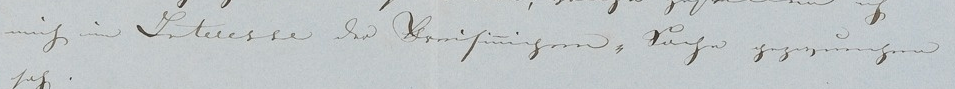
mich im Interesse der Freisinnigen-Sache gezwungen
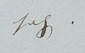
sah.
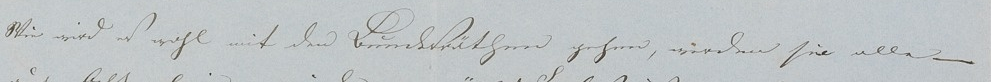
Wie wird es wohl mit den Bundesräthen gehen, werden sie alle –
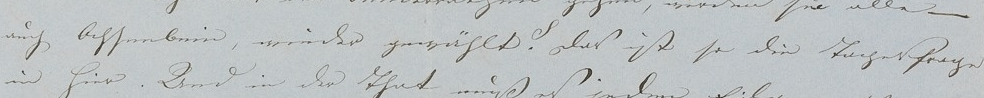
auch Ochsenbein, wieder gewählt? Das ist so die Tagesfrage
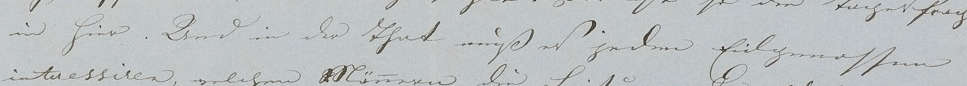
in hier. Und in der That muß es jeden Eidgenossen
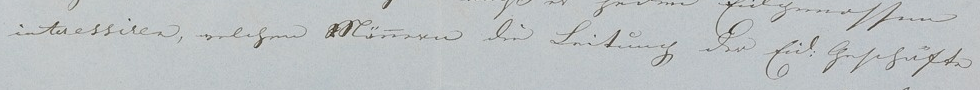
interessiren, welchen Männern die Leitung der Eid: Geschäfte
